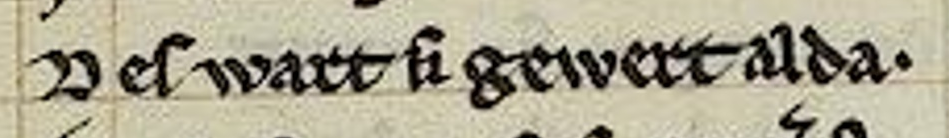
Deſ wart ſi gewert alda.
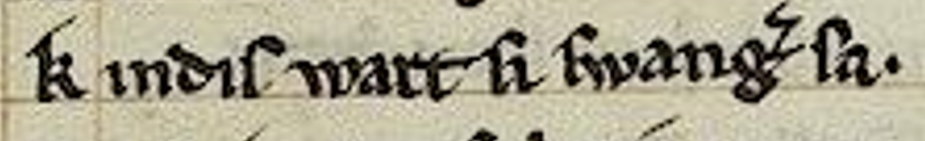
Kindiſ wart ſi ſwang(er) ſa.
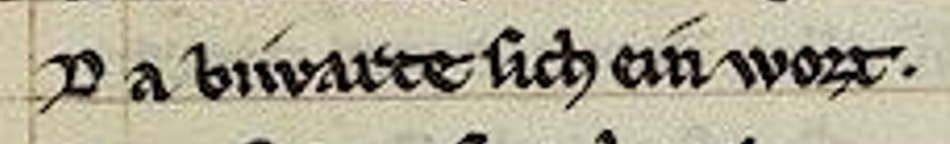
Da biwarte ſich ein wort.
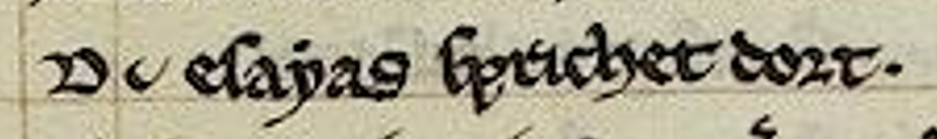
D(az) eſayas ſprichet dort.
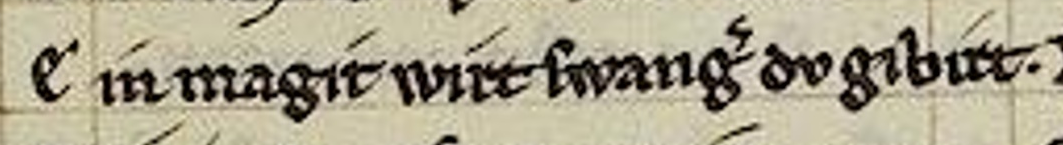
Ein magit wirt ſwang(er) dv gibirt.
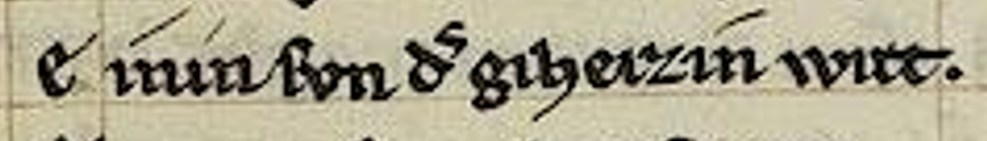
Einin ſvn d(er) giheizin wirt.
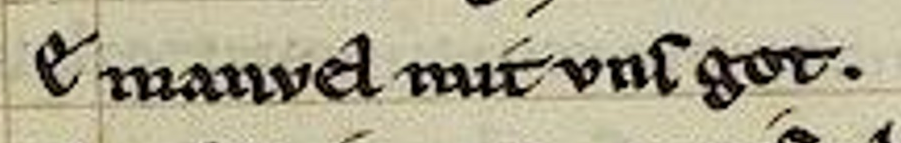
Emanvel mit vnſ got.
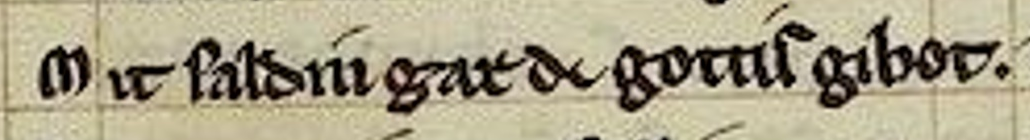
Mit ſaldin gar d(az) gottiſ gebot.
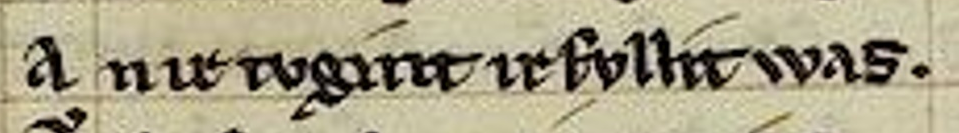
An ir tvgint irfvllit was.
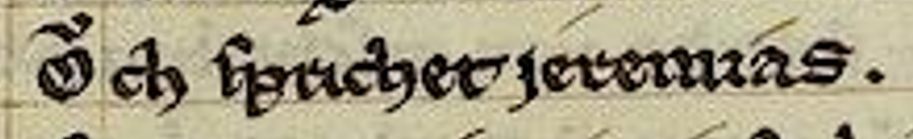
O°vch ſprichet jeremias.
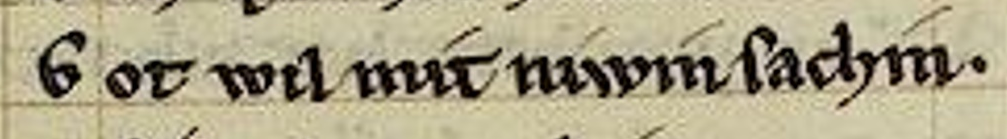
Got wil mit niwin ſachin.
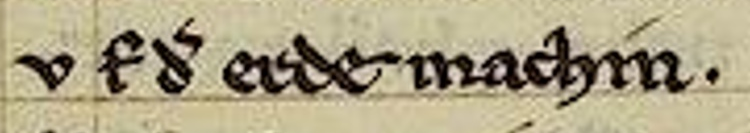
Vf d(er) erde machin.
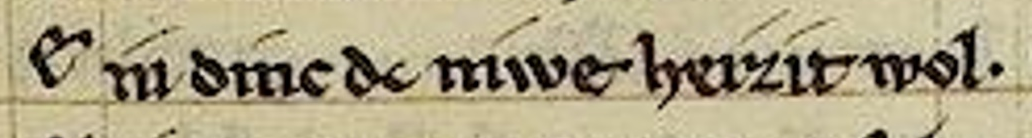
Ein dinc d(az) niwe heizit wol.
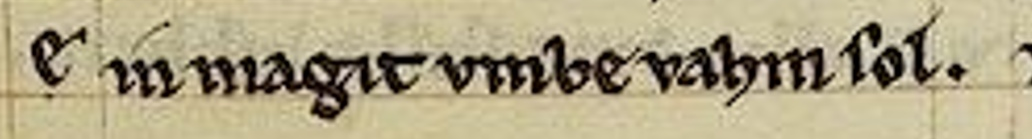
Ein magit vmbe vahin ſol.
